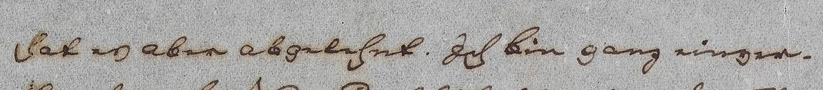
hat es aber abgelehnt. Ich bin ganz einver-
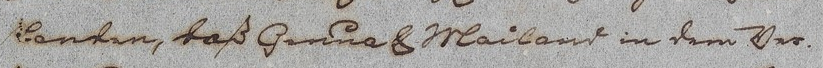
standen, daß Genua & Mailand in dem Ver-
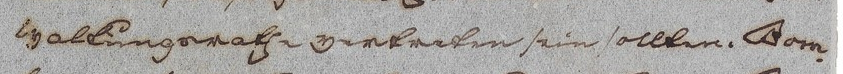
waltungsrathe vertreten sein sollten. Bom-
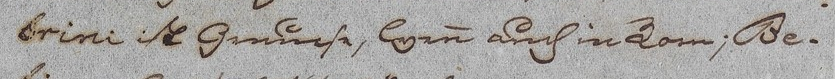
brini ist Genuese, wenn auch in Rom; Be-
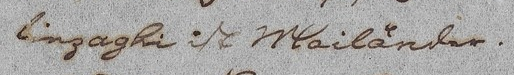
linzaghi ist Mailänder.
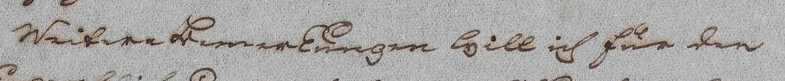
Weitere Bemerkungen will ich für den
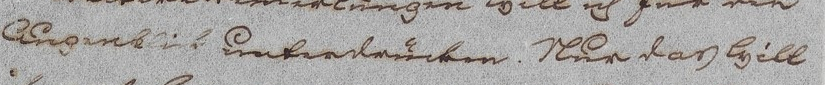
Augenblick unterdrücken. Nur das will
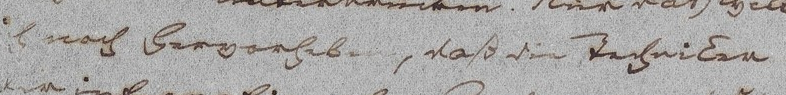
ich noch hervorheben, daß die Techniker
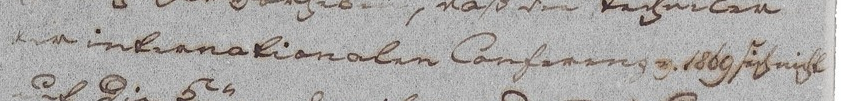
der internationalen Conferenz v. 1869 sich nicht
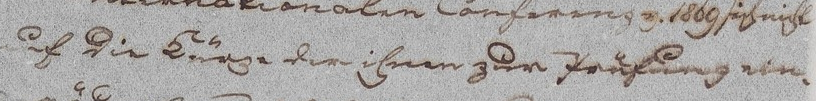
auf die Kürze der ihnen zur Prüfung ein-
